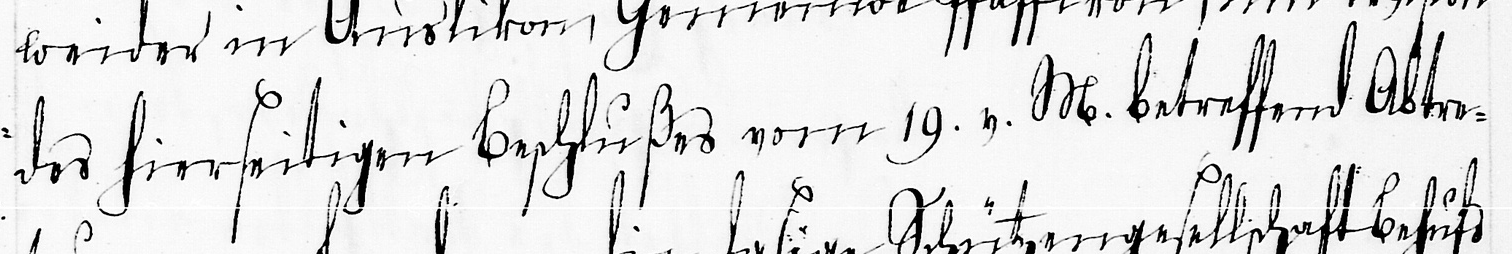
des hierseitigen Beschlußes vom 19. v. M. betreffend Abtre¬
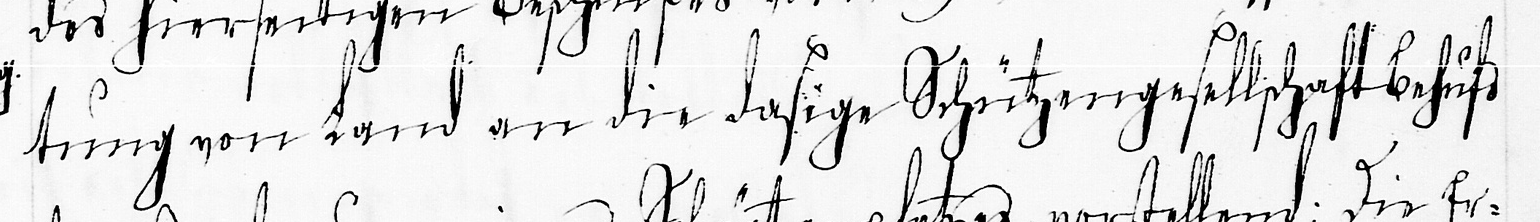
tung von Land an die dasige Schützengesellschaft Behufs
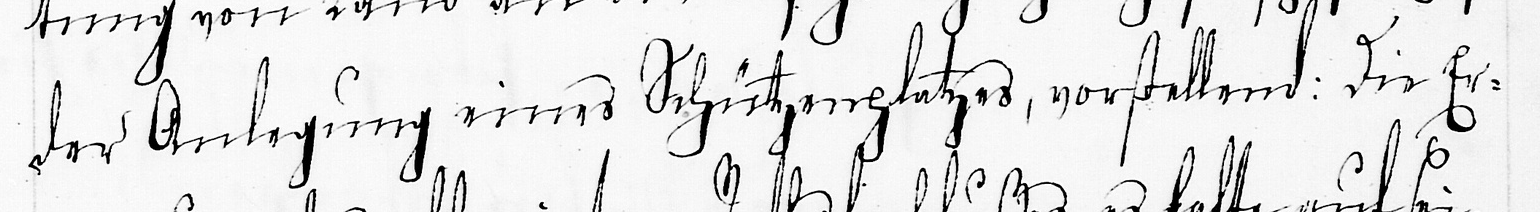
der Anlegung eines Schützenplatzes, vorstellend: Die Er¬
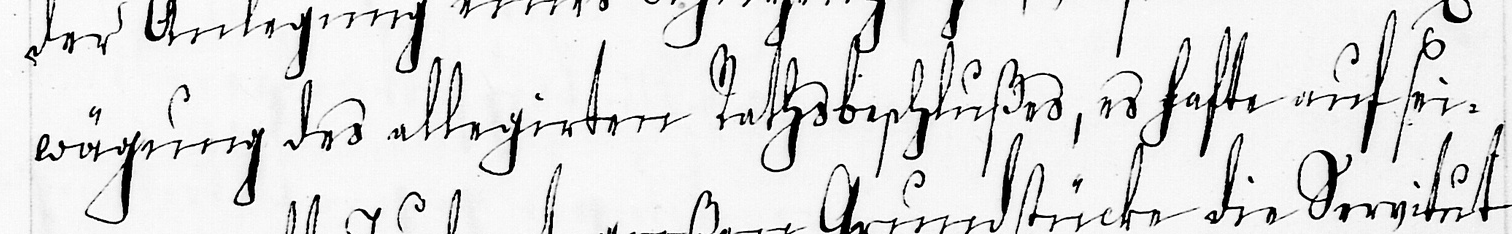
wägung des allegirten Rathsbeschlußes, es hafte auf sei¬
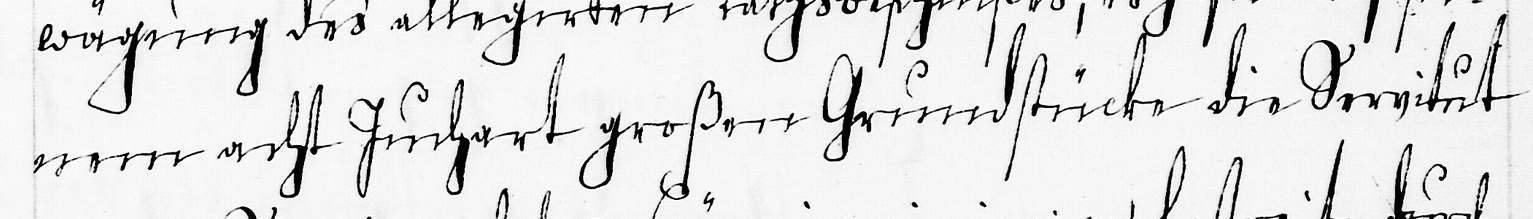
nem acht Juchart großen Grundstücke die Servitut
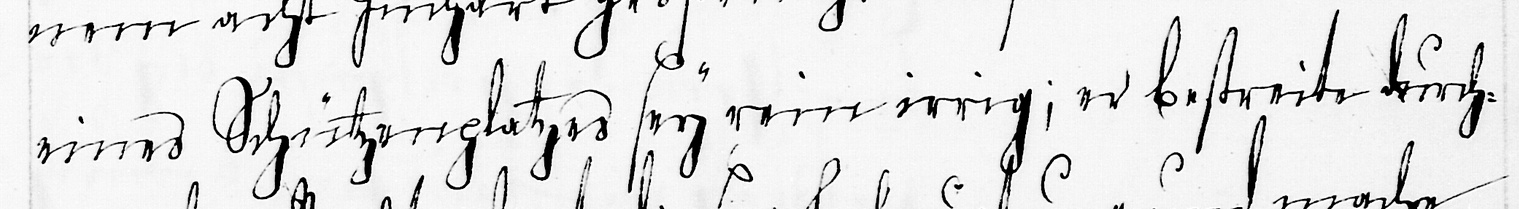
eines Schützenplatzes sey rein irrig; er bestreite durch¬
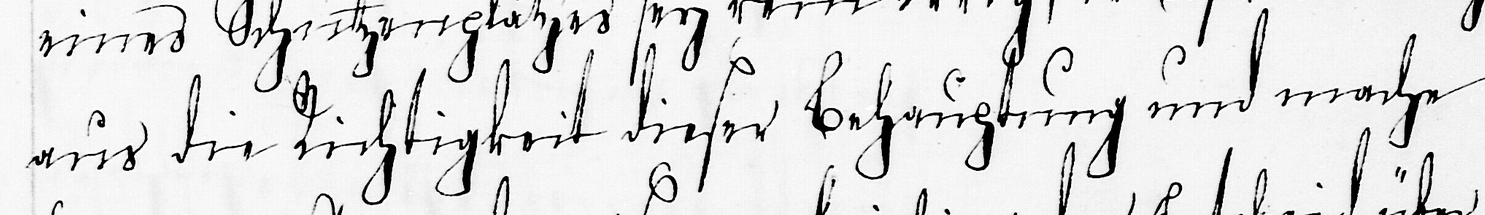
aus die Richtigkeit dieser Behauptung und mache
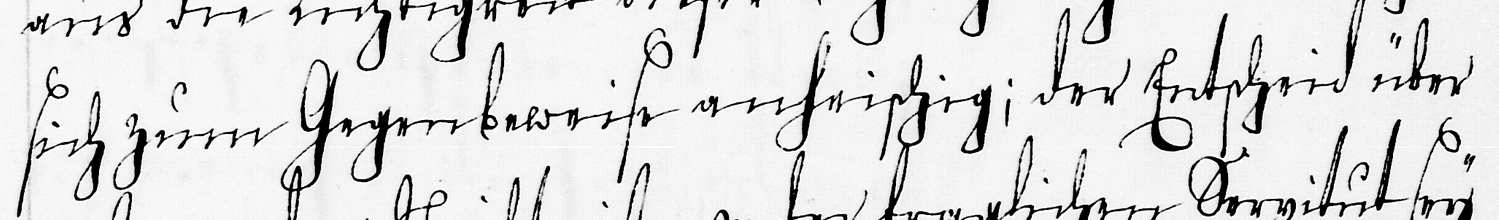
sich zum Gegenbeweise anheischig; der Entscheid über
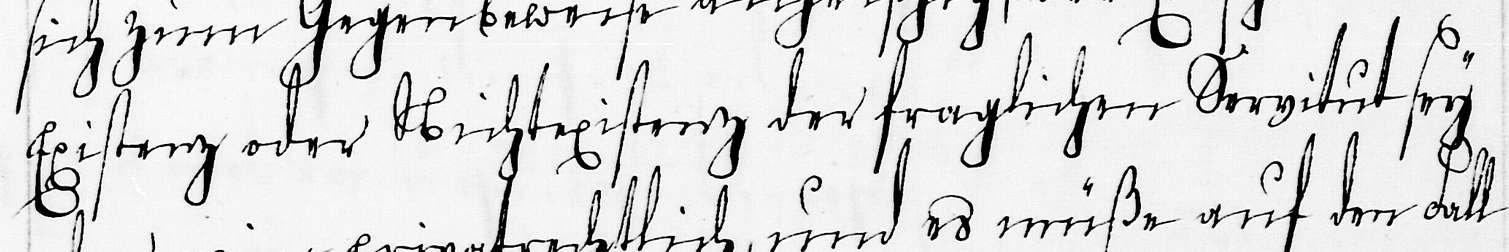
Existenz oder Nichtexistenz der fraglichen Servitut sey
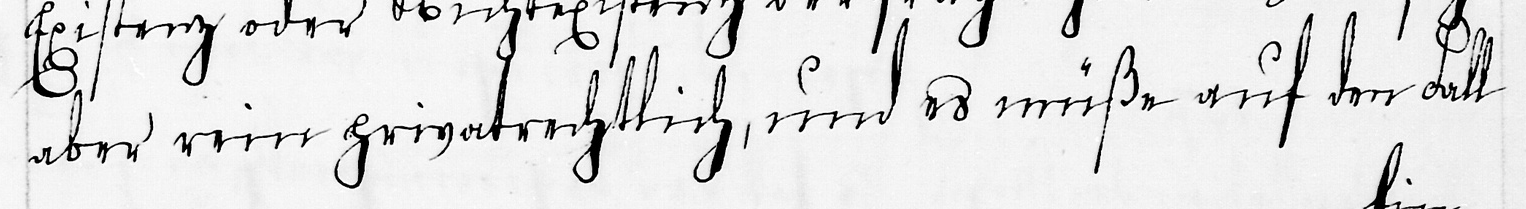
aber rein privatrechtlich, und es müße auf den Fall
